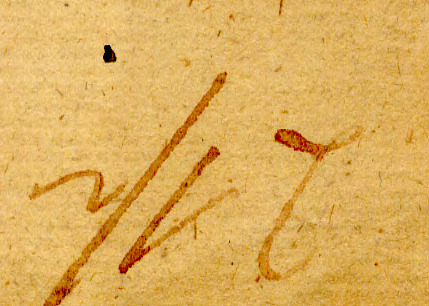2 1/2
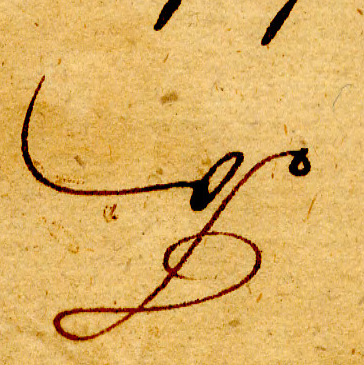To
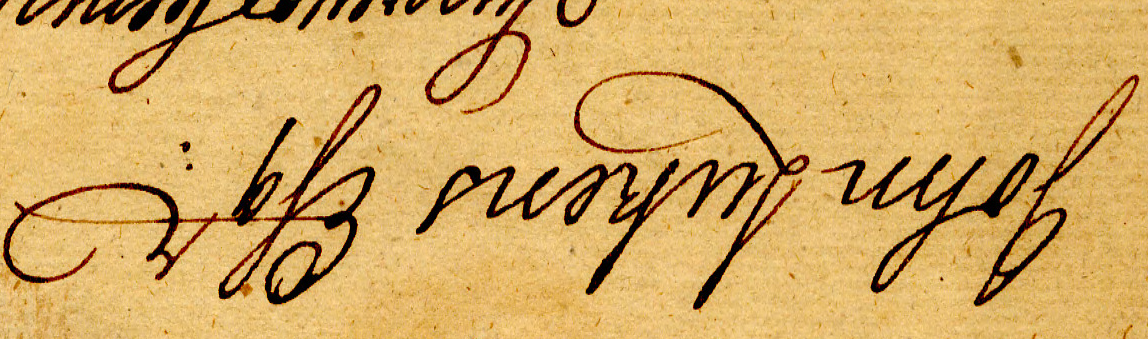John Lukens Esq^r.
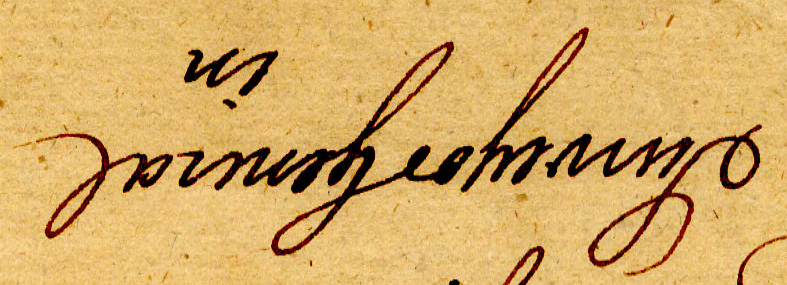Surveyor General
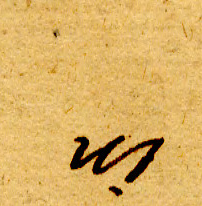in
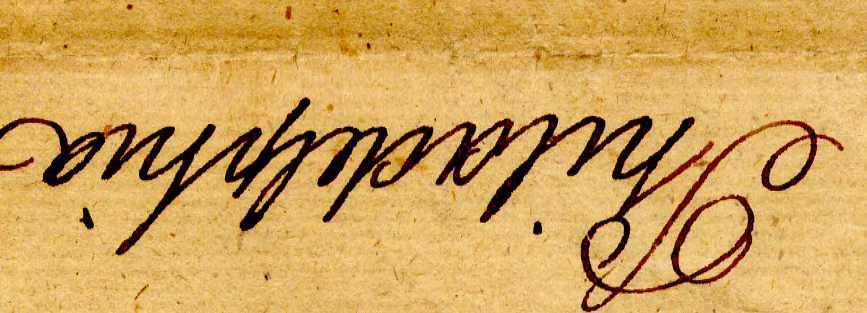Philadelphia
